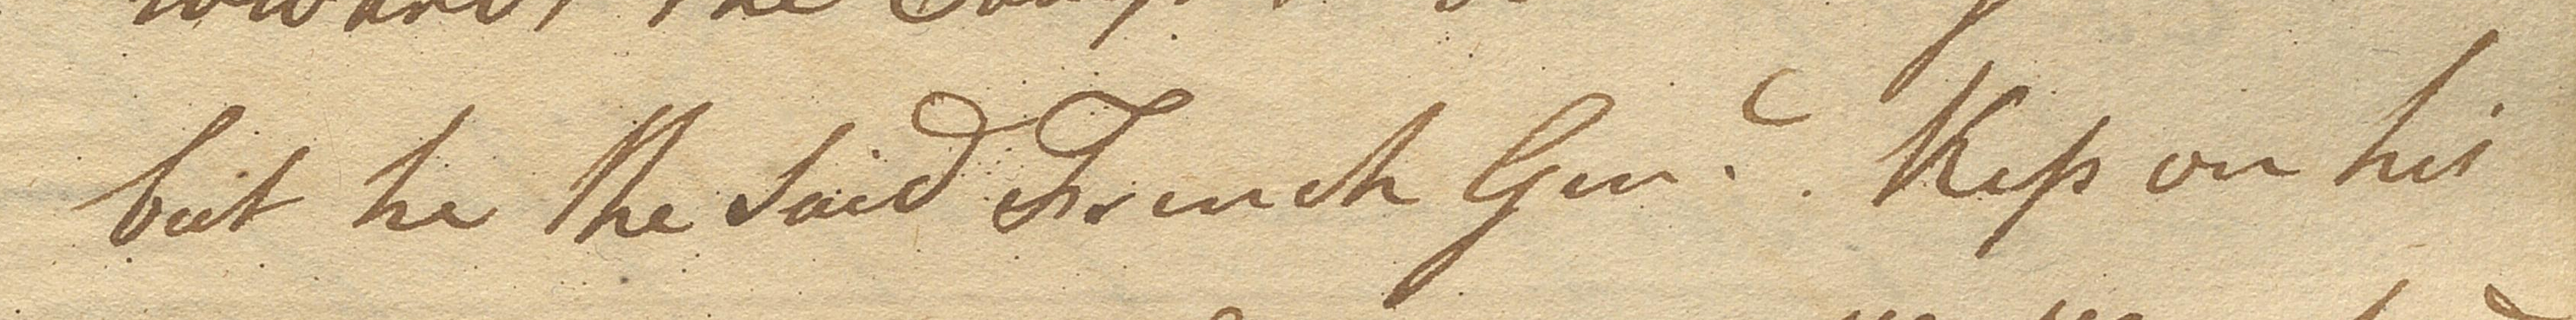but he the said French Gen^l. Kep on his
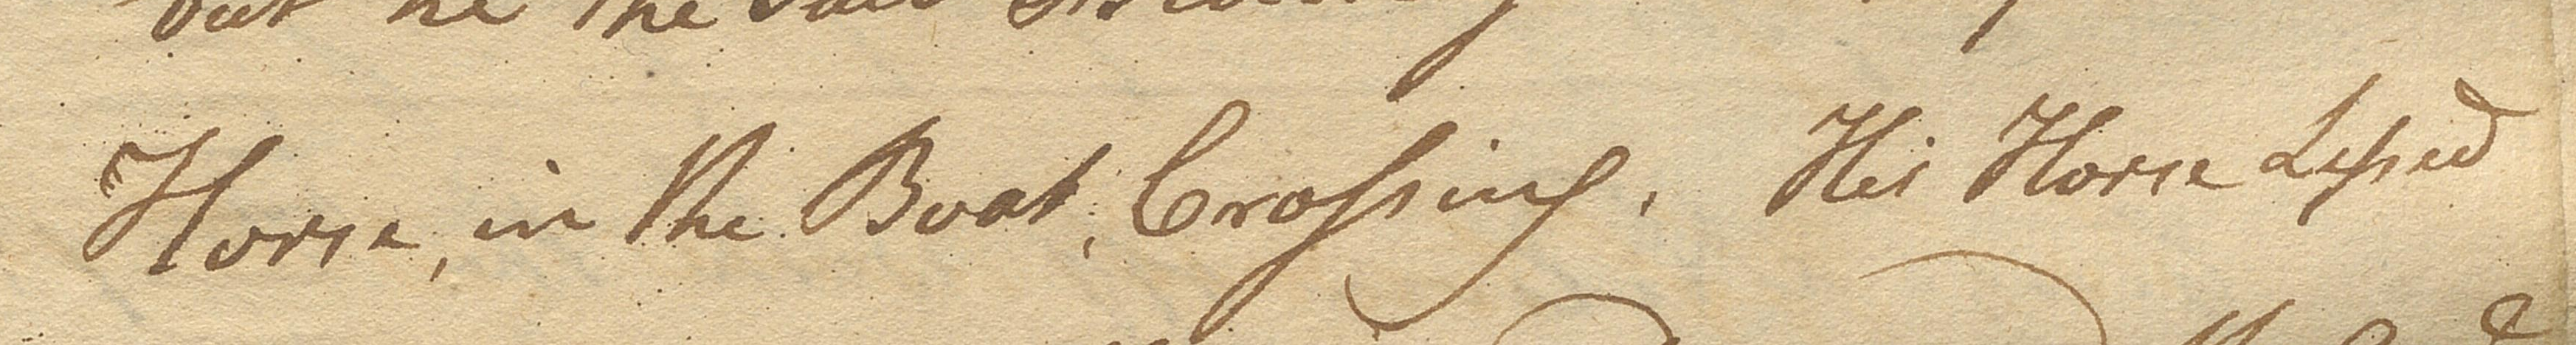Horse, in the Boat Crossing. His Horse Leped
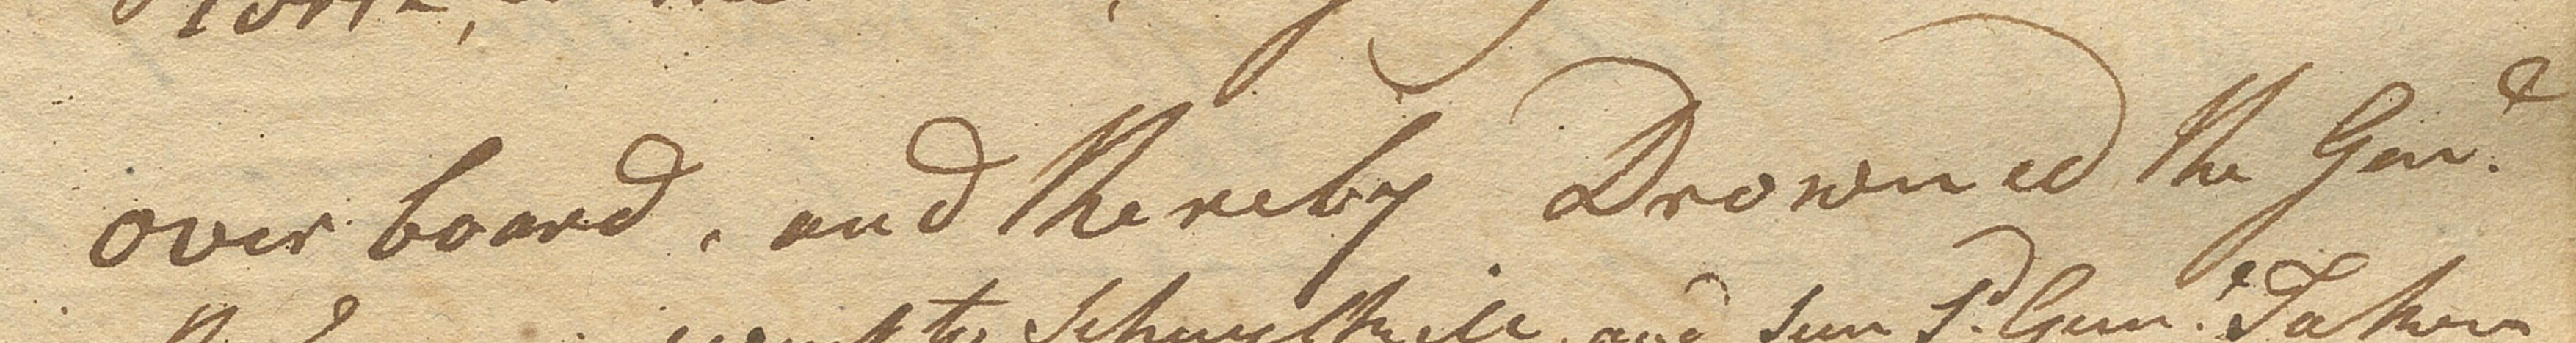over board. and thereby Drowned the Gen^l.
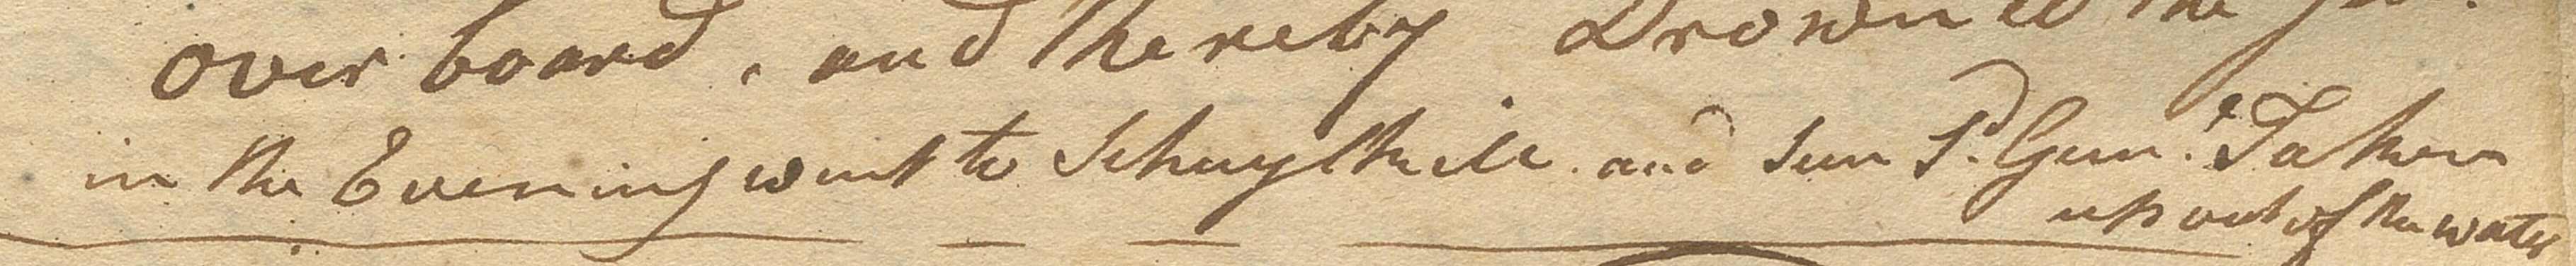in the Evening went to Schuylkill, and seen S^d. Gen^l. Taken
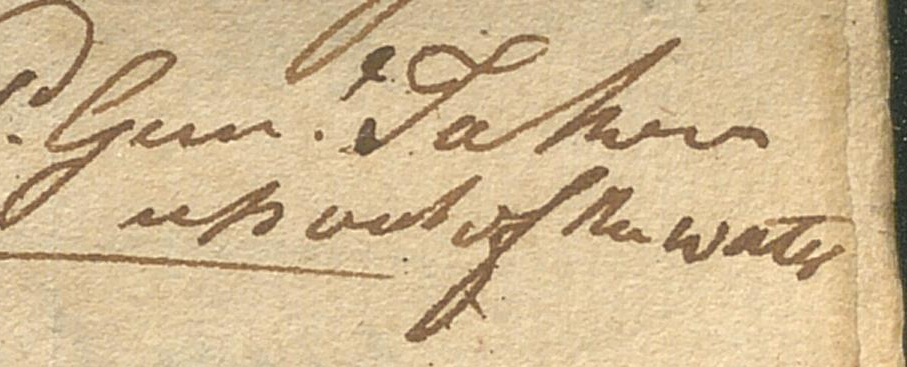up out of the water
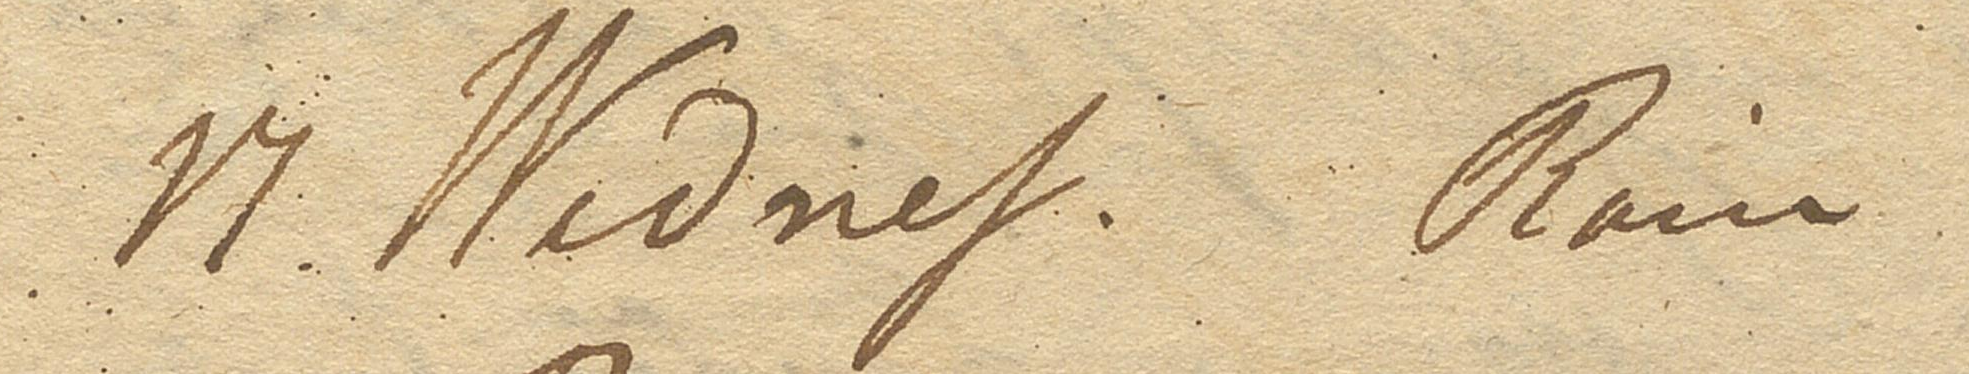17. Wednes. Rain
